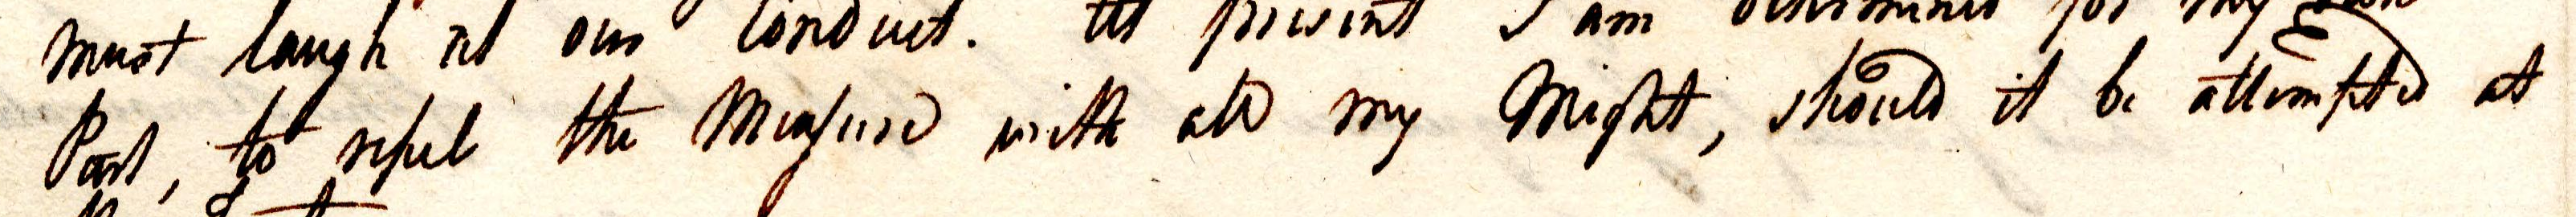Part, to repel the Miasuse with all my Might, should it be attempted at
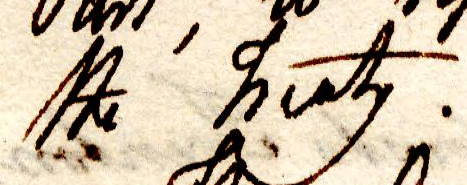the Treaty.
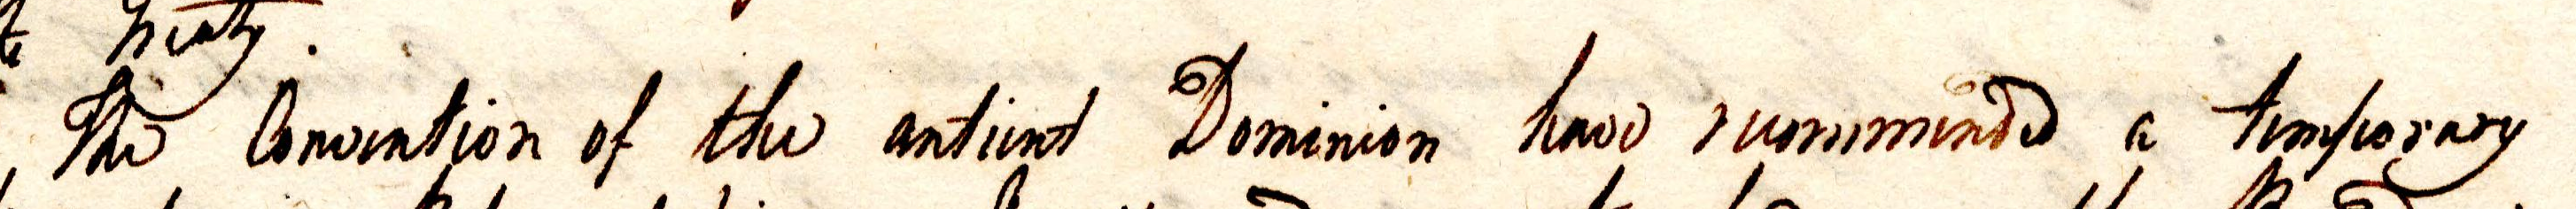The Convention of the antient Dominion have recommended a temporary
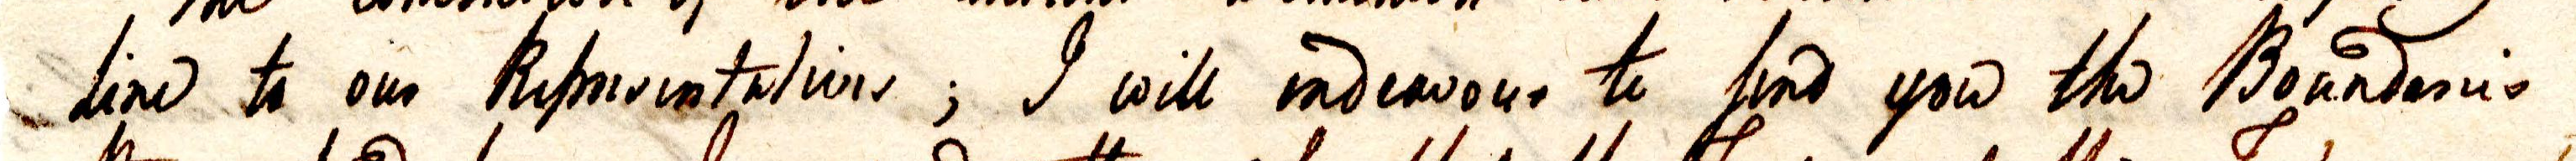Line to our Representations; I will endeavour to find you the Boundaries
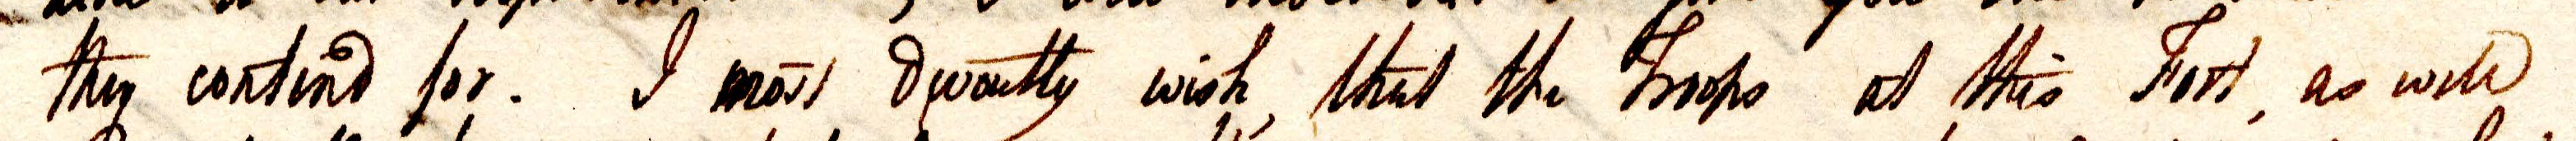they contend for. I most devoutly wish that the Troops at this Fort, as well
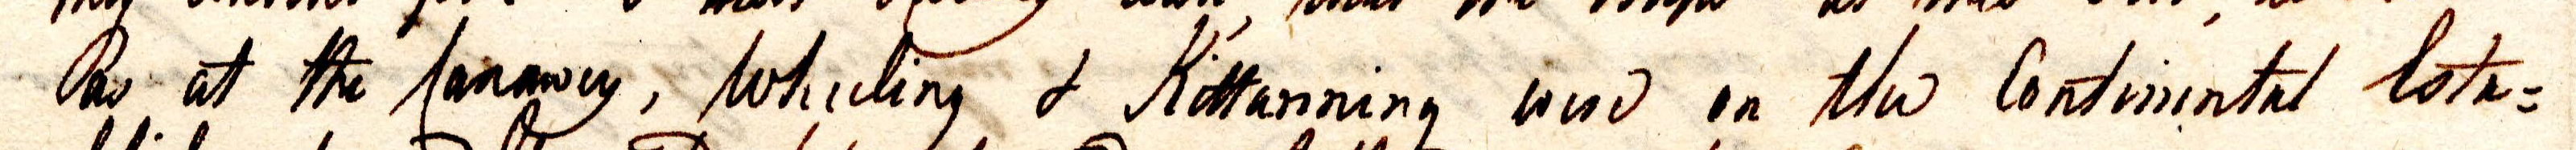as at the Canaway, Wheeling & Kittanning were in the Continental Esta-
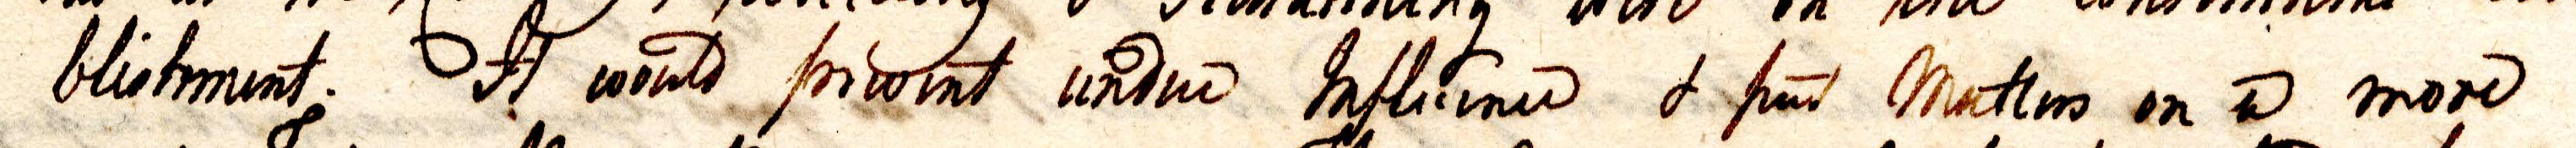blishment. It would prevent undue Influence & put Matters on a more
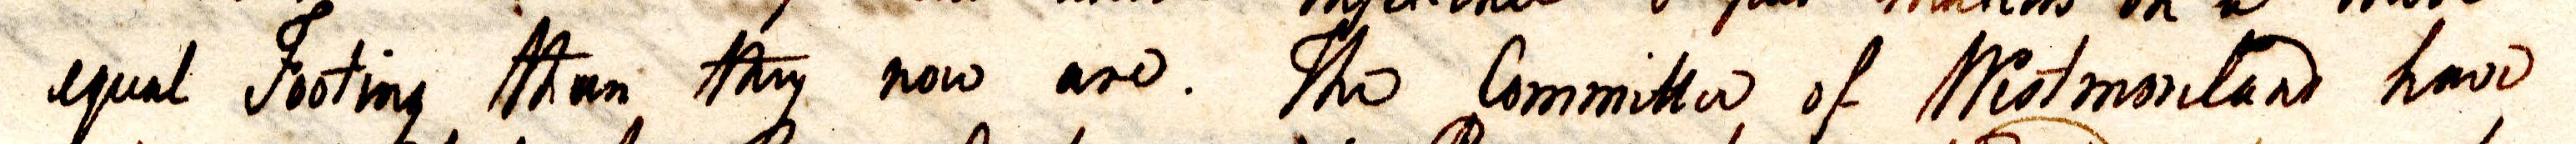equal Footing than they now are. The Committee of Westmoreland have
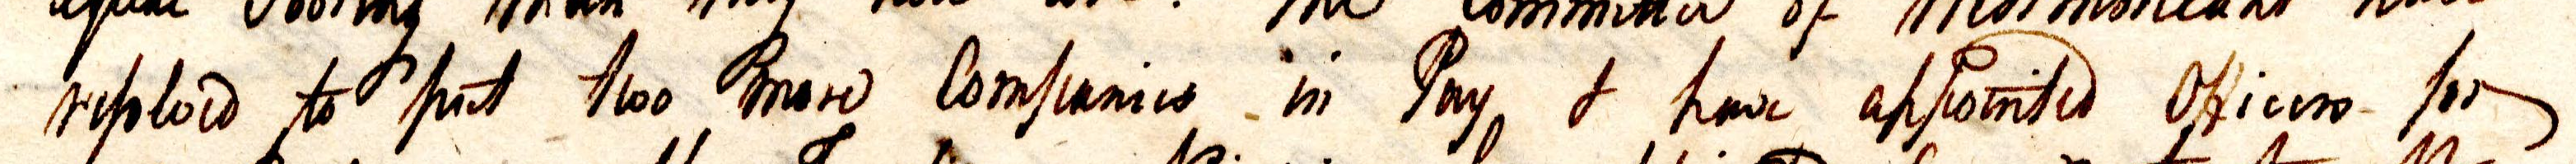resolved to put two more Companies in Pay & have appointed Officers for
